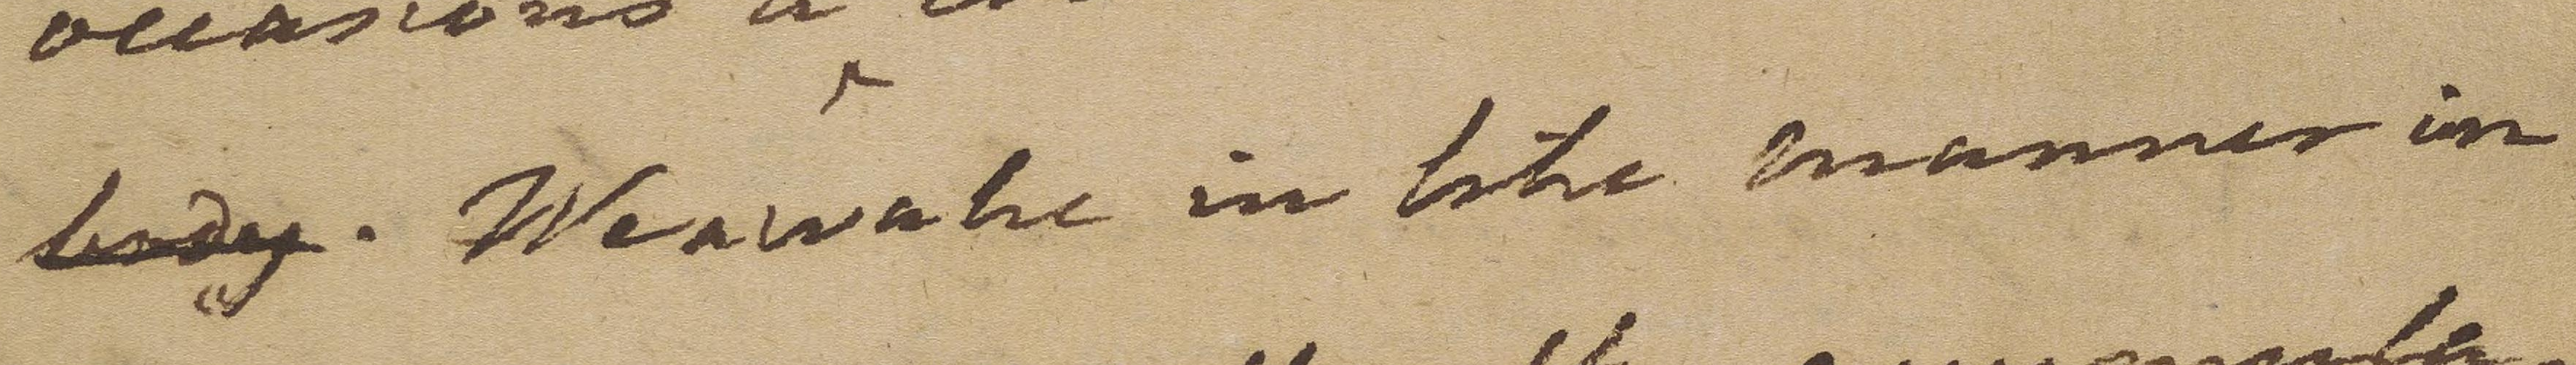[body]. We awake in like manner in
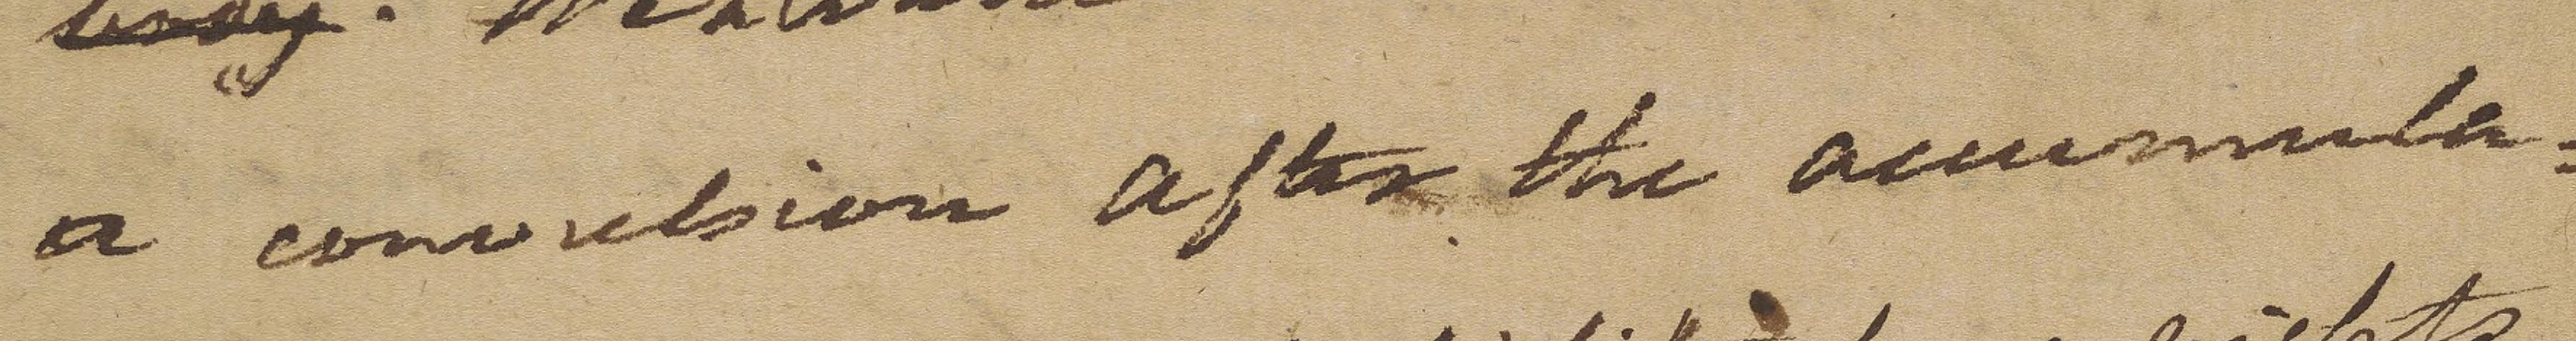a convulsion after the accumula-
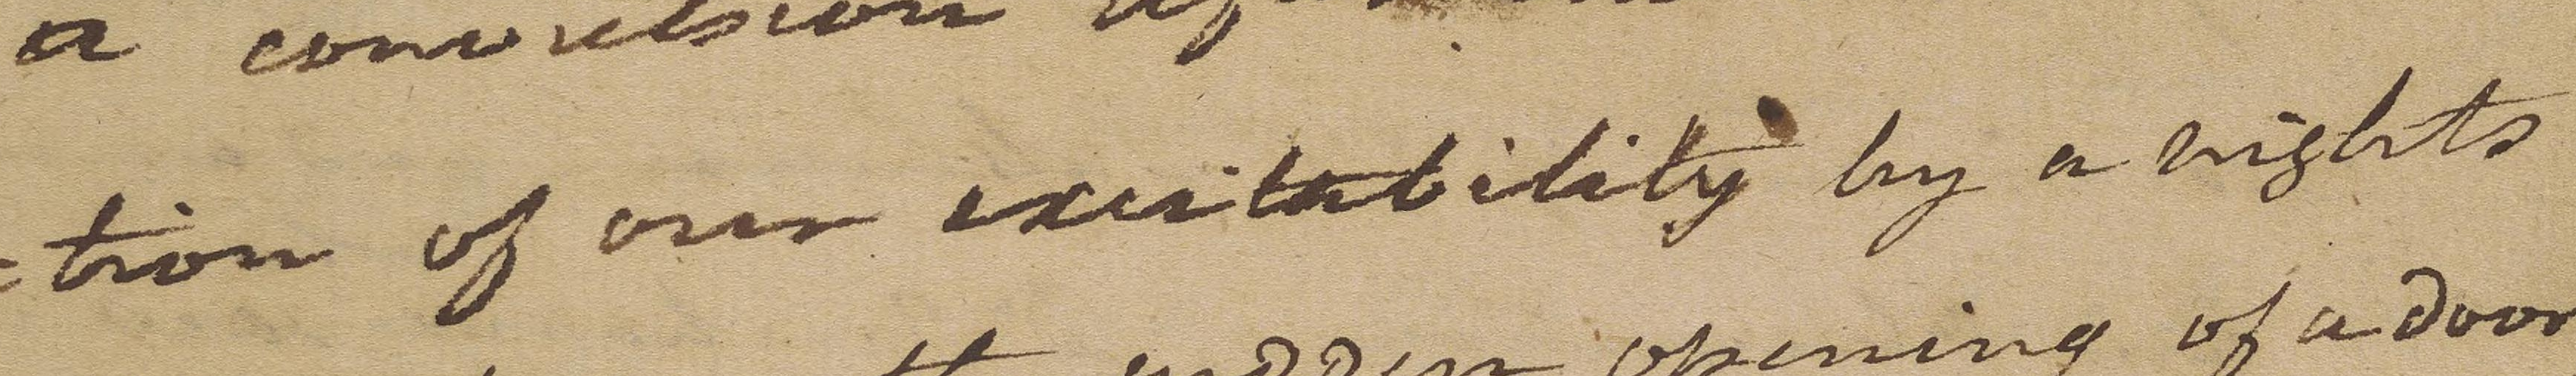-tion of over excitability by a nights
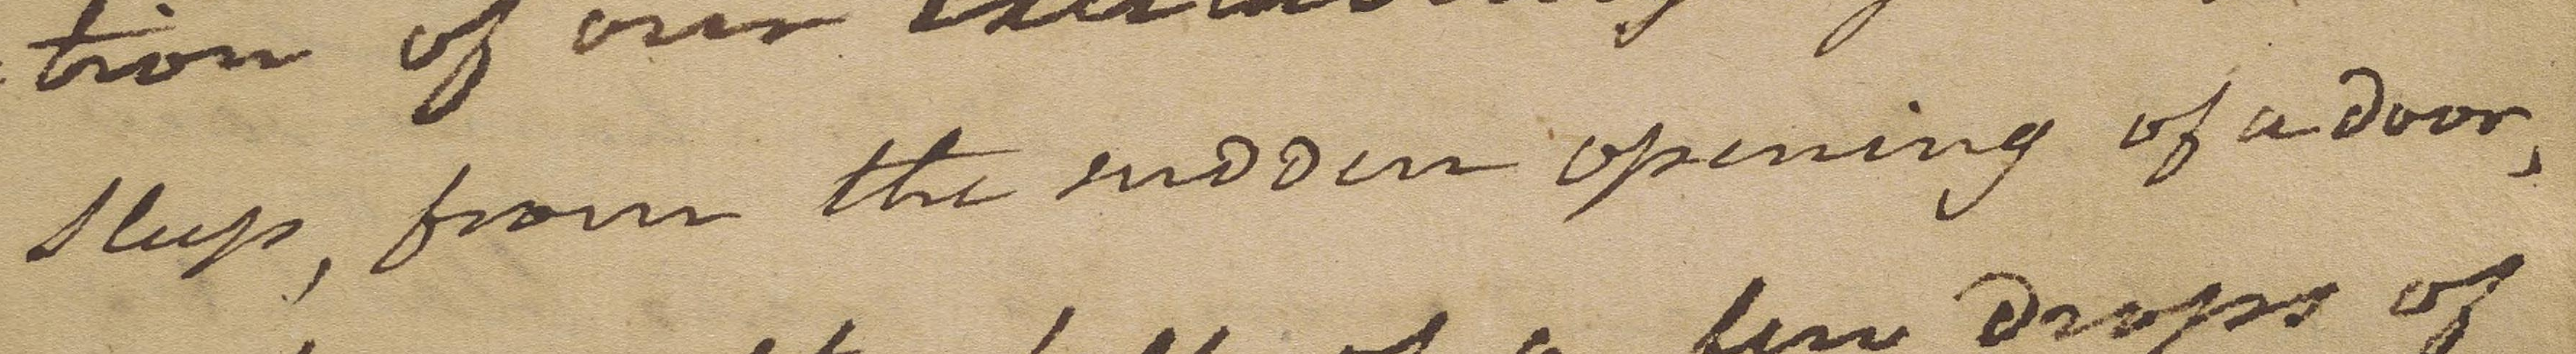sleep, from the sudden opening of a door,
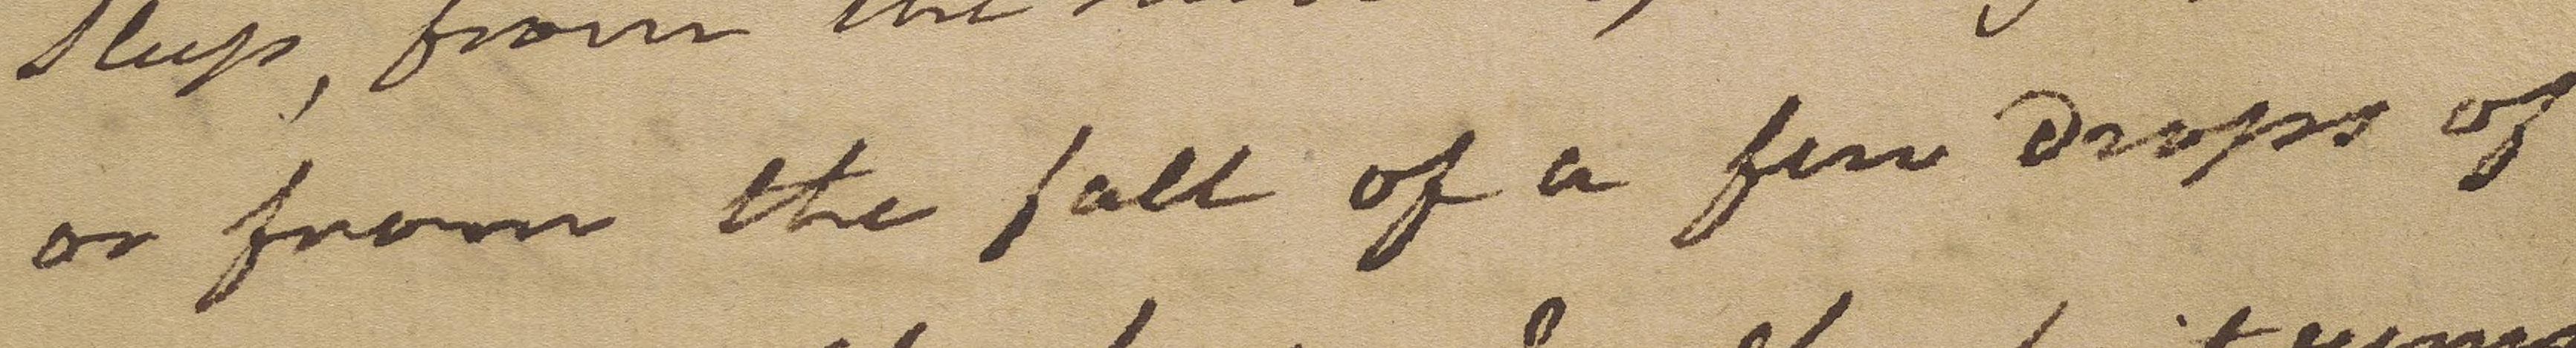or from the fall of a few drops of
